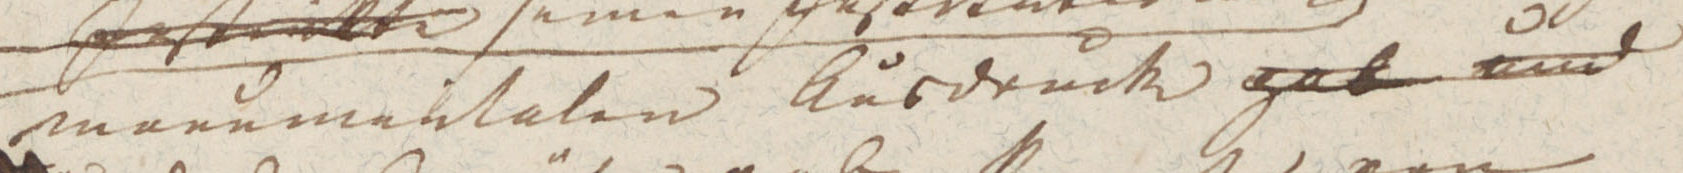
monumentalen Ausdruck gab und
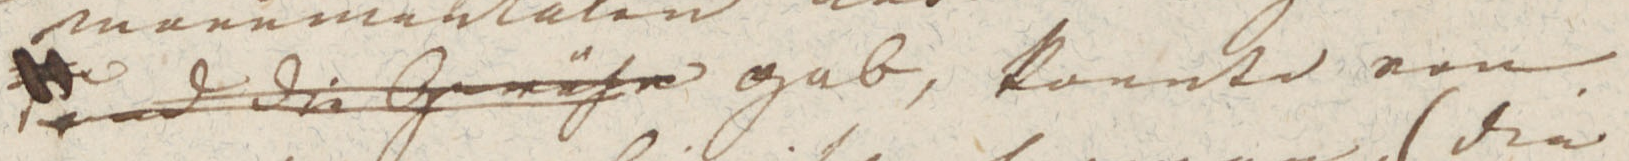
und die Gewähr gab, konnte von
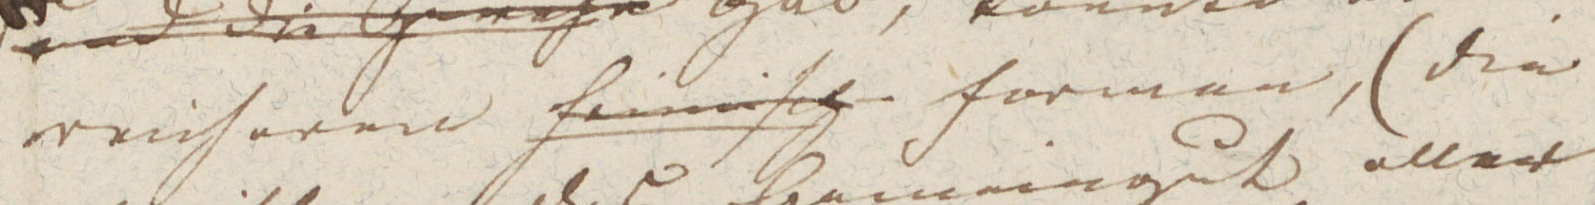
reicheren heimisch Formen, (die
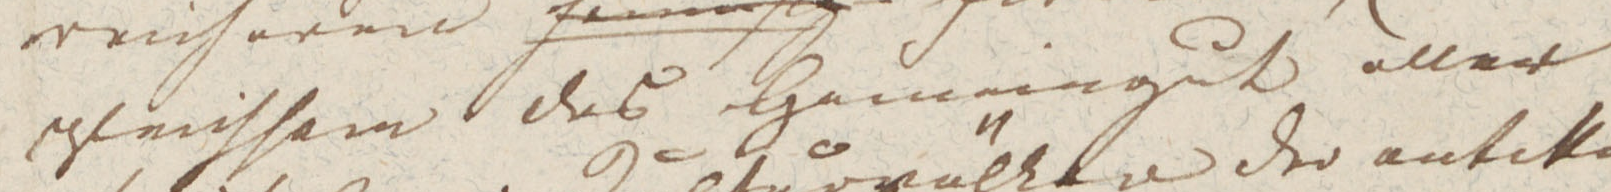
gleichsam das Gemeingut aller
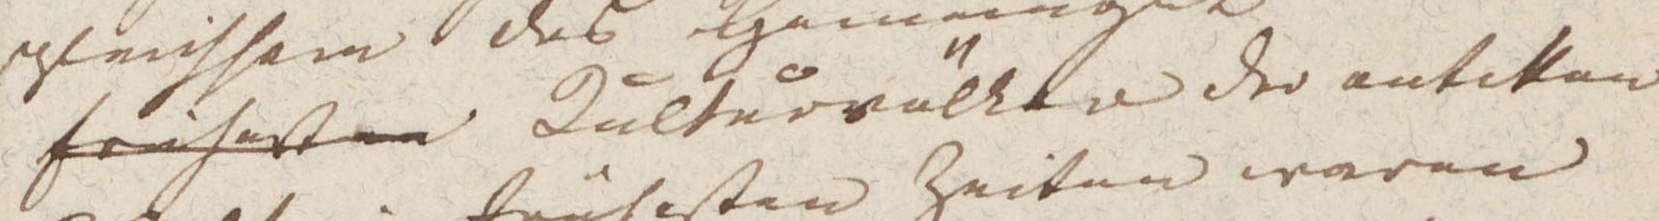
frühesten Kulturvölker der antiken
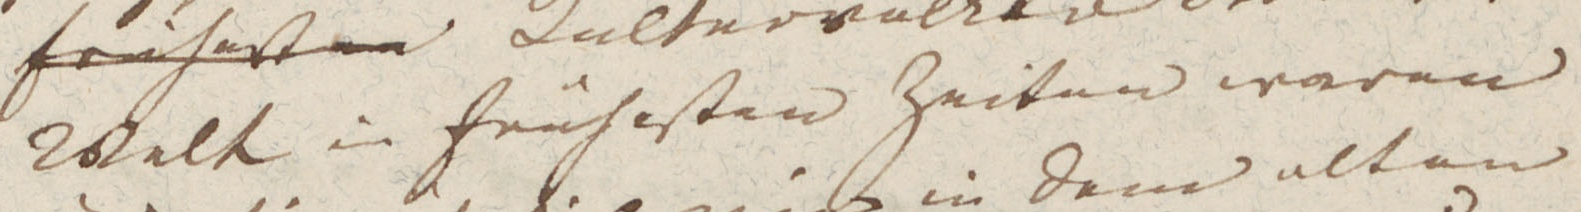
Welt in frühesten Zeiten waren
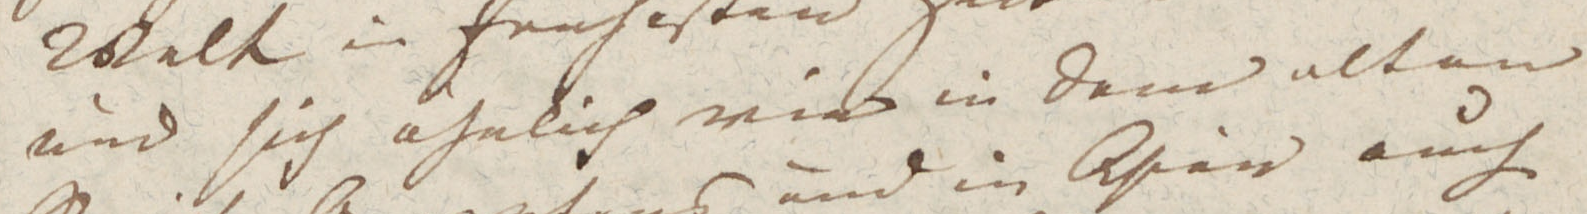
und sich ähnlich wie in dem alten
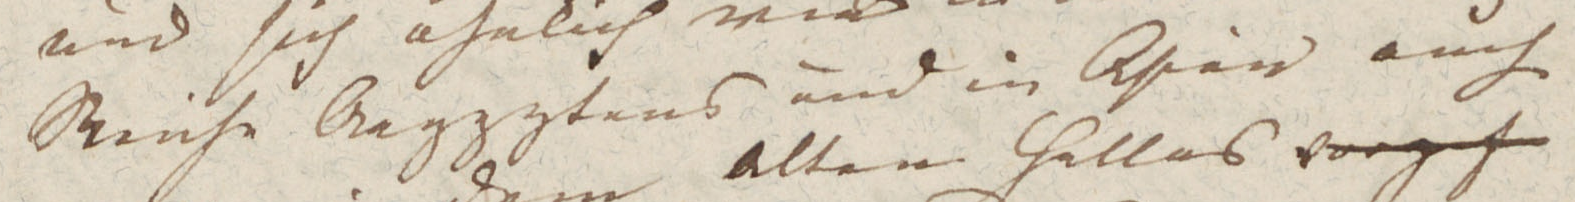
Reiche Aegyptens und in Asien auch
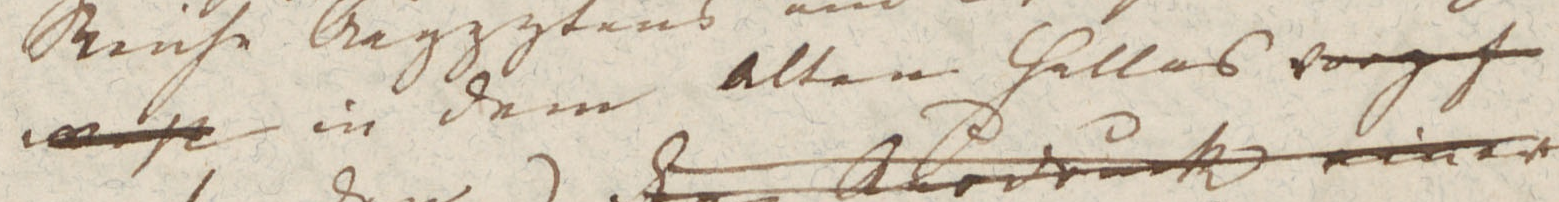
wohl in dem alten Hellas vorgef
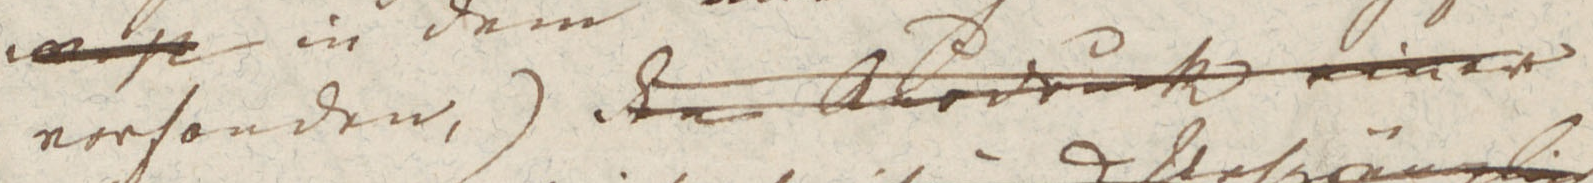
vorfanden.) da Ausdruck einer
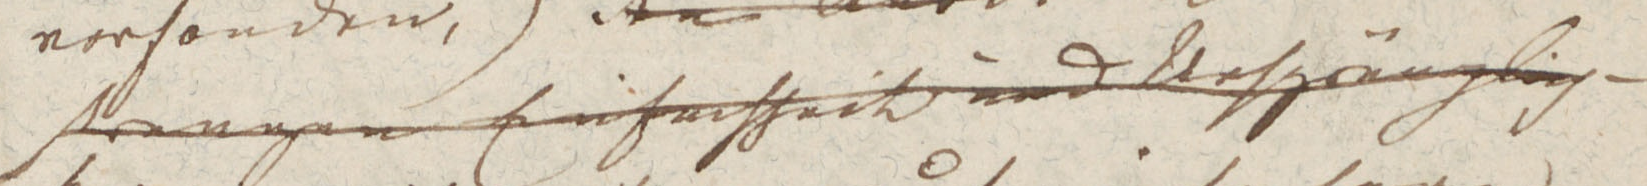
strengen Einfachheit und Ursprünglich-
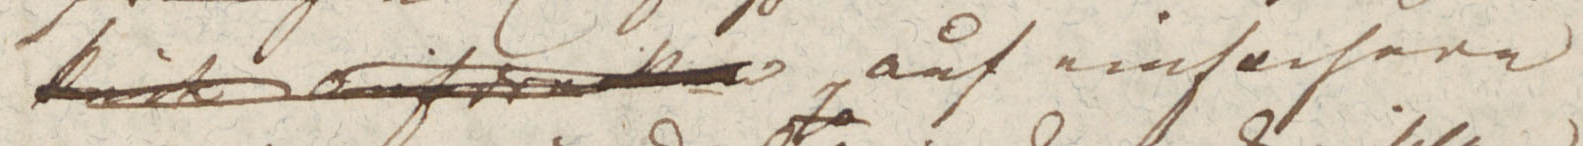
keit aufdrucken auf einfachere
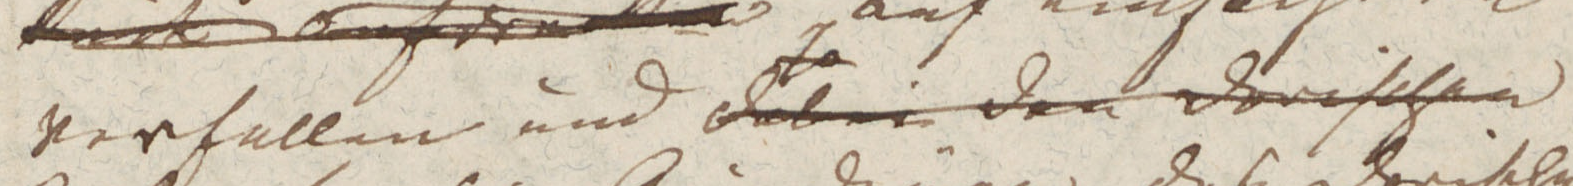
verfallen und dabei so den Dorischen
